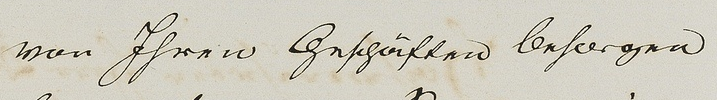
von Ihren Geschäften besorgen
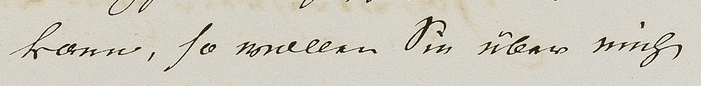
kann, so wollen Sie über mich
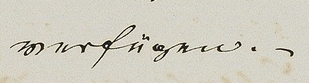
verfügen. –
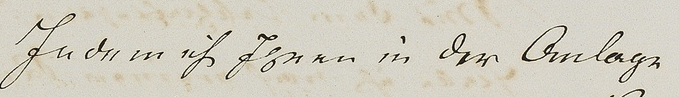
Indem ich Ihnen in der Anlage
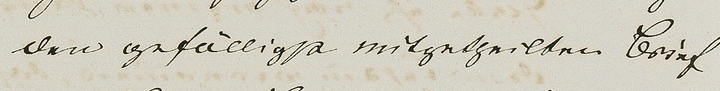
den gefälligst mitgetheilten Brief
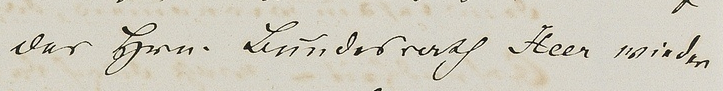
des Hrn. Bundesrath Heer wieder
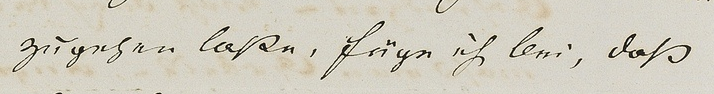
zugehen laße, füge ich bei, daß
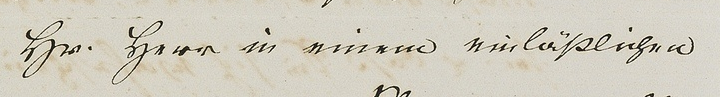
Hr. Heer in einem einläßlichen
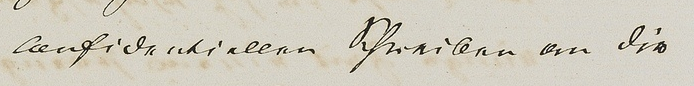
confidentiellen Schreiben an die
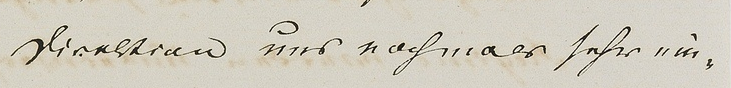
Direktion uns nochmals sehr ein-
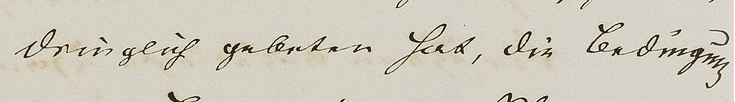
dringlich gebeten hat, die Bedingung
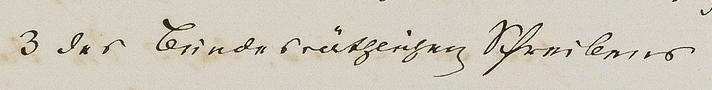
3 des bundesräthlichen Schreibens
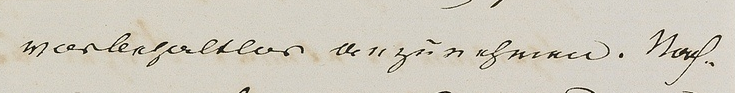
vorbehaltlos anzunehmen. Nach-
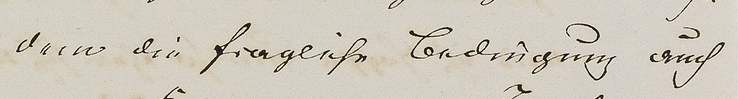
dem die fragliche Bedingung auch
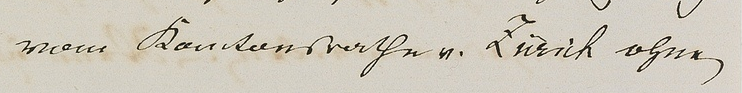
vom Kantonsrathe v. Zürich ohne
